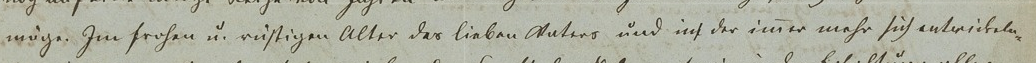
möge. Im frohen u. rüstigen Alter des lieben Vaters und in der immer mehr sich entwickeln-
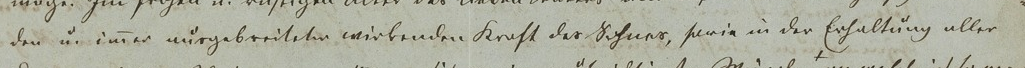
den u. immer ausgebreiteter wirkenden Kraft des Sohnes, sowie in der Erhaltung aller
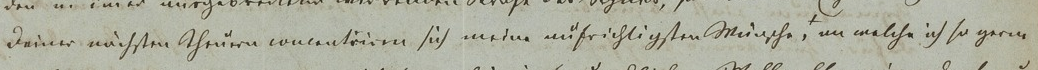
Deiner nächsten Theuern concentriren sich meine aufrichtigsten Wünsche, an welche ich so gerne
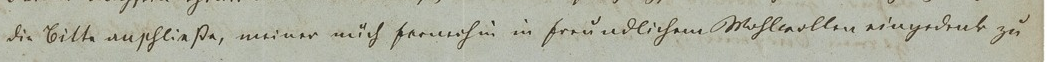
die Bitte anschließe, meiner auch fernerhin in freundlichem Wohlwollen eingedenk zu
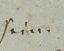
sein.
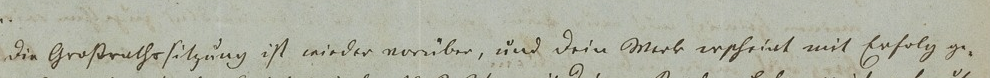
Die Großrathssitzung ist wieder vorüber, und Dein Werk erscheint mit Erfolg ge-
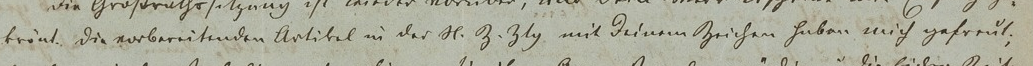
krönt. Die vorbereitenden Artikel in der N. Z. Ztg mit Deinem Zeichen haben mich gefreut;
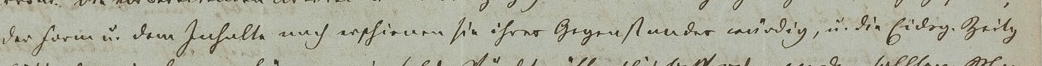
der Form u. dem Inhalte nach erschienen sie ihres Gegenstandes würdig, u. die Eidsg. Zeitg
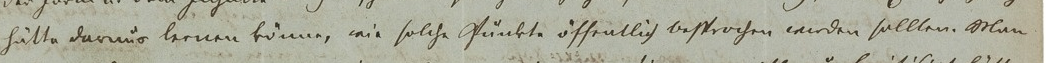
hätte daraus lernen können, wie solche Punkte öffentlich besprochen werden sollten. Man
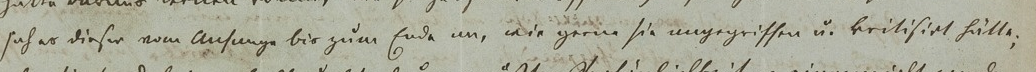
sah es dieser vom Anfange bis zum Ende an, wie gerne sie angegriffen u. kritisiert hätte;
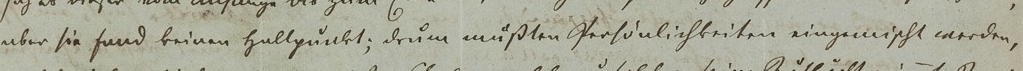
aber sie fand keinen Haltpunkt; drum mußten Persönlichkeiten eingemischt werden,
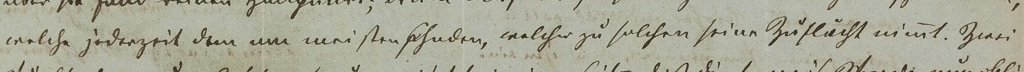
welche jederzeit dem am meisten schaden, welcher zu solchen seine Zuflucht nimmt. Zwei
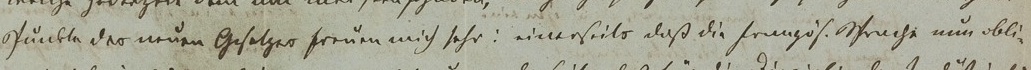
Punkte des neuen Gesetzes freuen mich sehr: einerseits daß die französ. Sprache nun obli-
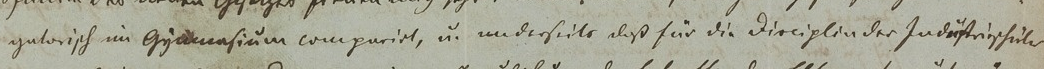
gatorisch im Gymnasium comparirt, u. anderseits daß für die Disciplin der Industrieschüler
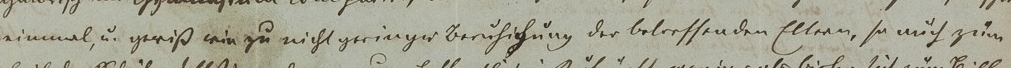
einmal, u. gewiß wie zu nicht geringer Beruhigung der betreffenden Eltern, so auch zum
